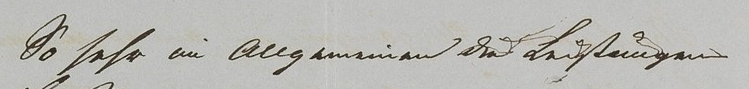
So sehr im Allgemeinen die Leistungen
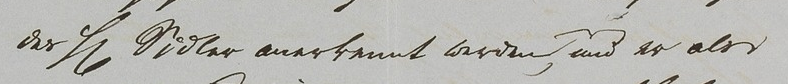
des H. Sidler anerkannt werden, und er als
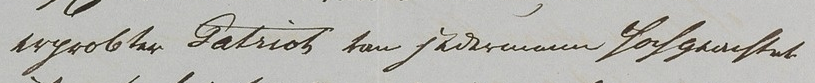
erprobter Patriot von jedermann hochgeachtet
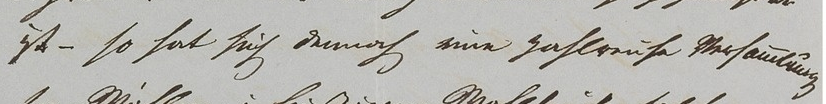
ist – so hat sich dennoch eine zahlreiche Versammlung
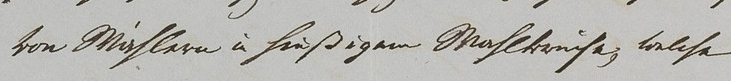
von Wählern in hießigem Wahlkreise, welche
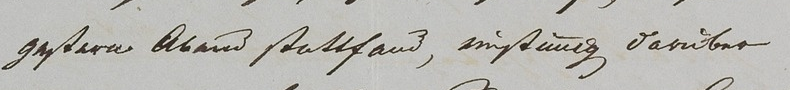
gestern Abend stattfand, einstimmig darüber
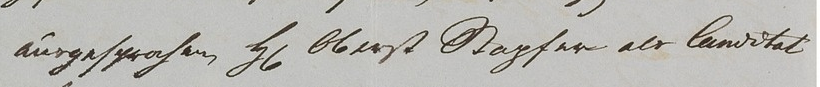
ausgesprochen, Hr. Oberst Stapfer als Candidat
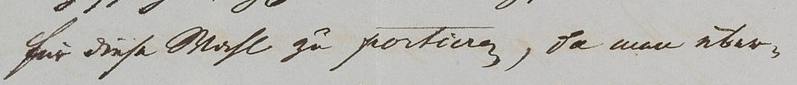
für diese Wahl zu portieren, da man über-
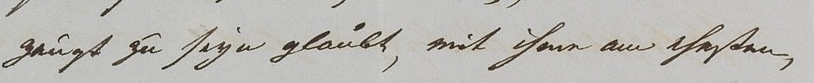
zeugt zu seyn glaubt, mit ihme am ehesten,
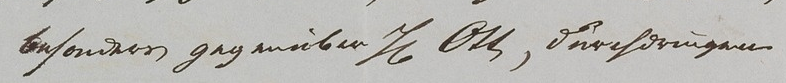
besonders gegenüber Hr. Ott, durchdringen
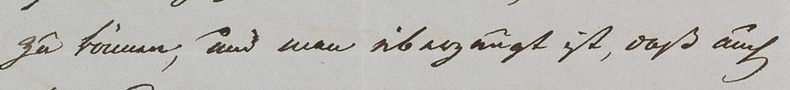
zu können, und man überzeugt ist, daß auch
